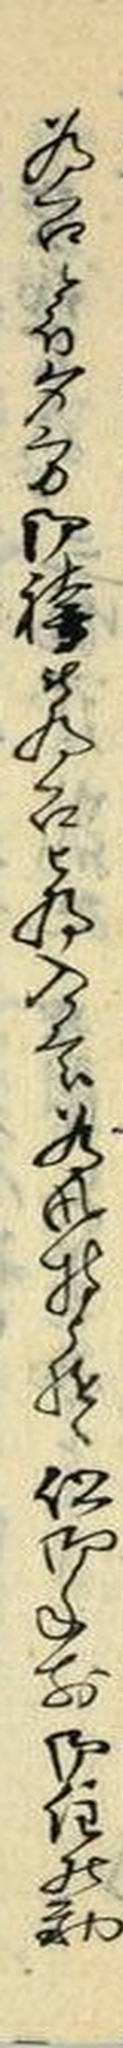為召候ニ付夕方御絝被為召被為入候節為御持被遊候但御手前御住居勤
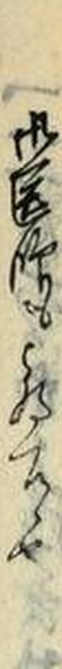御医師も被為召候由
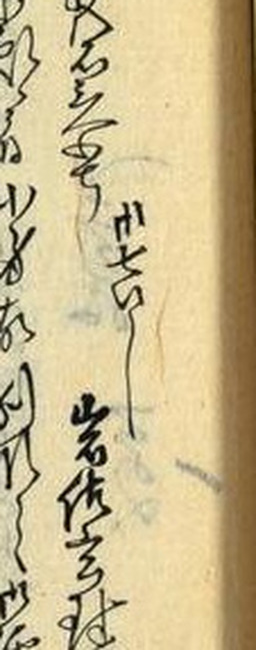御匕いし
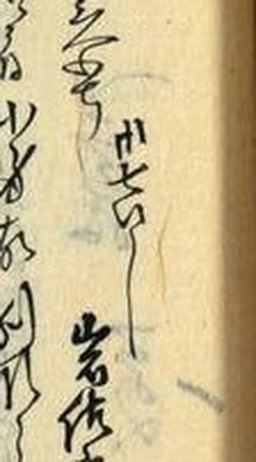御匕いし
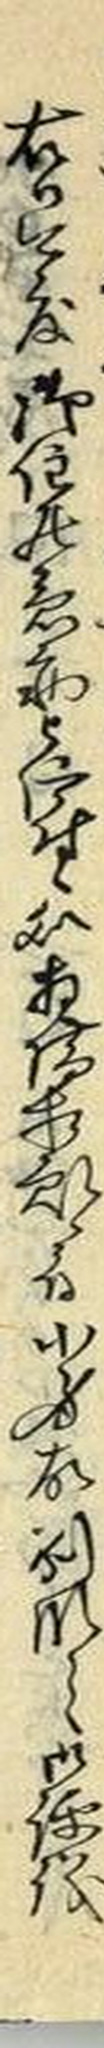右ハ今度御住居兼勤被仰付候処拝借相願候ニ付小身故別段御評議
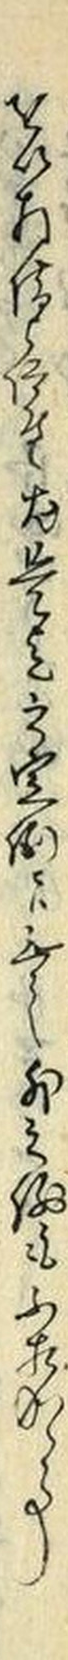を以拝借被仰付候尤是迄之定例ニハ無之外之例ニも不相成候事
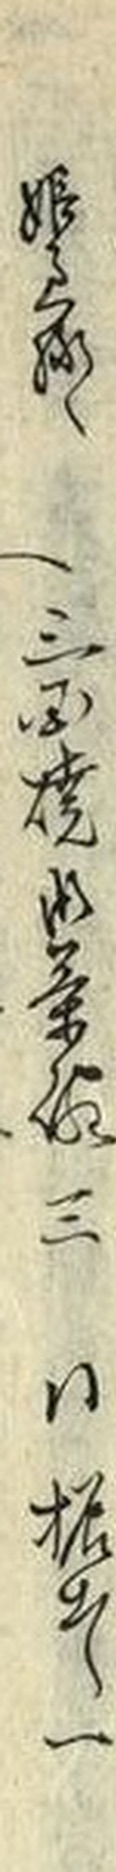姫君様へ三国焼御茶碗三同振出し一
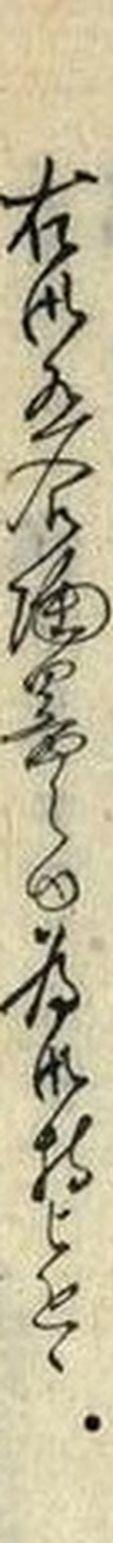右御有合陶器之内為御持被進候
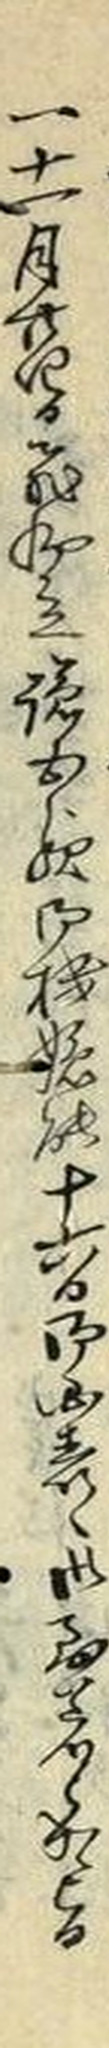一十一月廿四日飛脚立謙五郎様御機嫌能十六日御国表へ御到着被成候旨
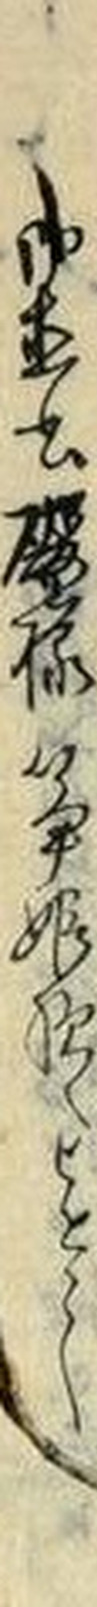御直書殿様箏姫様へ被進之

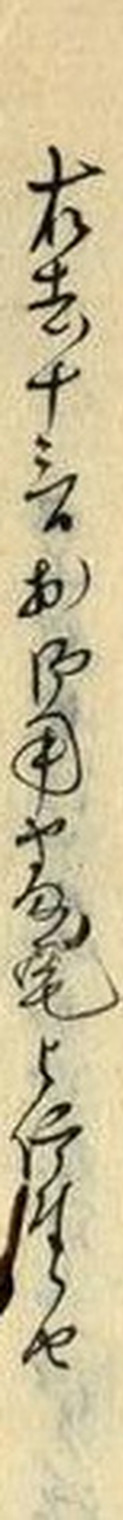右去十三日於御用番宅被仰付候由
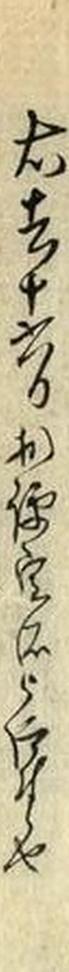右去十六日於評定所被仰付候由
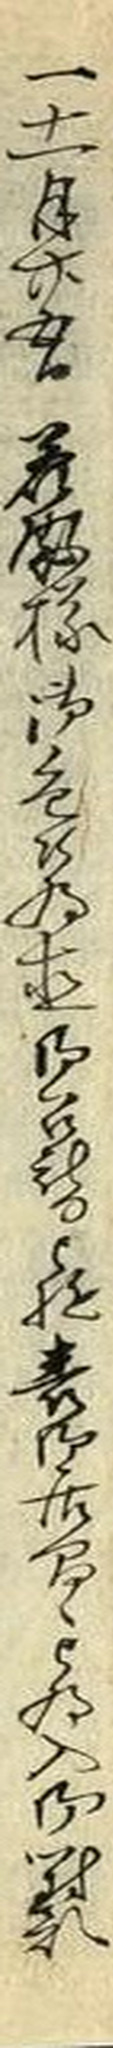一十一月廿五日若殿様御色被為直御召替被遊表御居間へ被為入御対顔
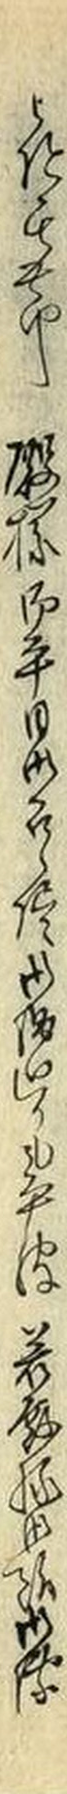被遊其節殿様御平日御召候侭御側廻りも平服若殿様御附御傅
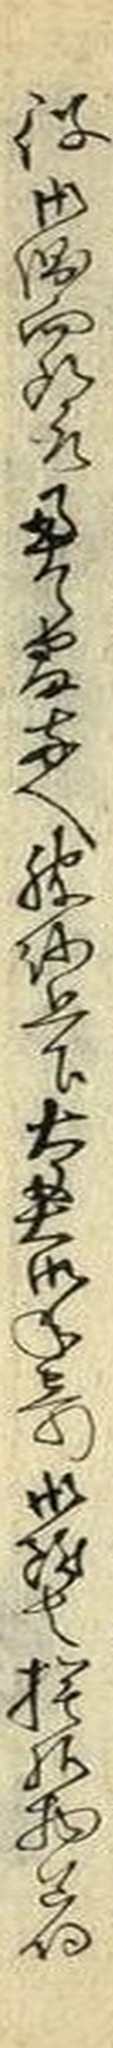役御側向頭取奥之番両人服紗上下大奥御年寄御附は模様物着
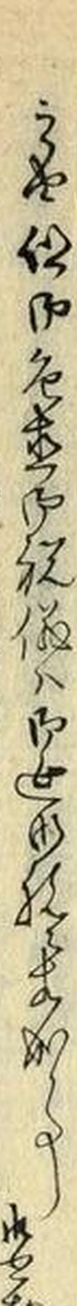候由但御色直御祝儀ハ御延御祝ニ相成候事
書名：少傅日録抄（斉承付側向頭取日記、在府）
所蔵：福井県文書館 Fukui Prefectural Archives
